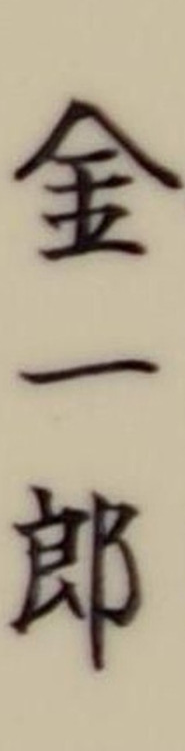金一郎
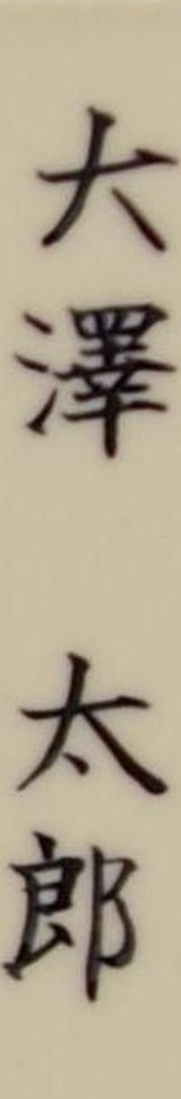大澤太郎
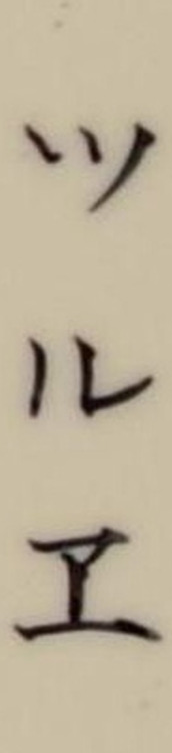ツルエ
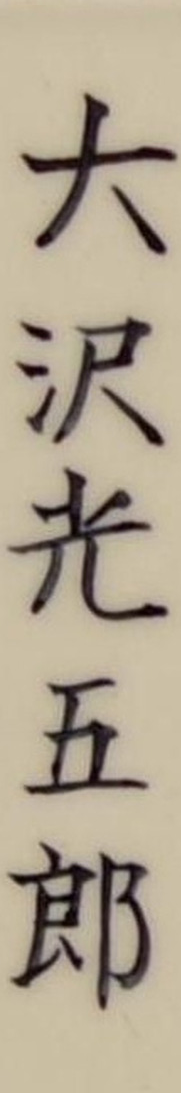大沢光五郎
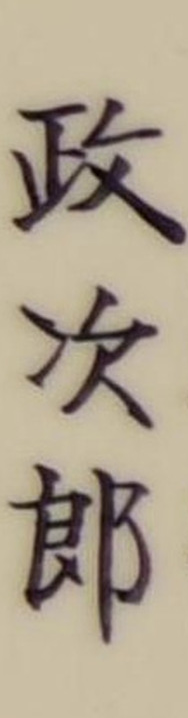政次郎
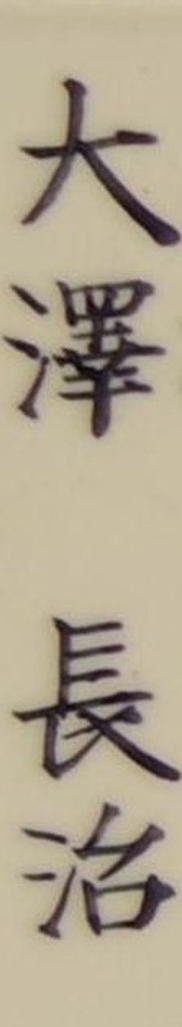大澤長治
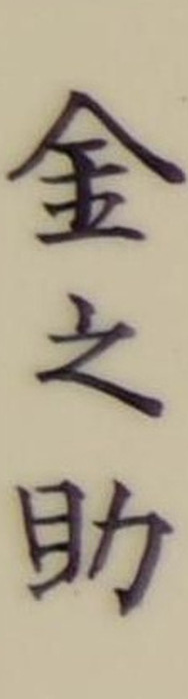金之助

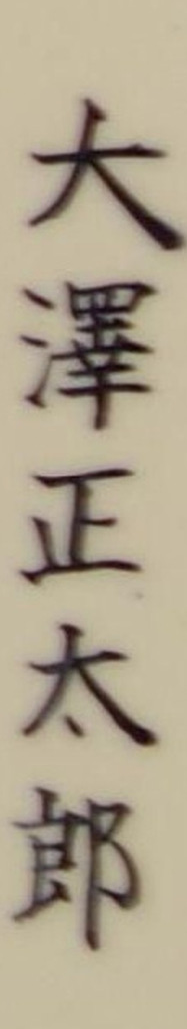大澤正太郎
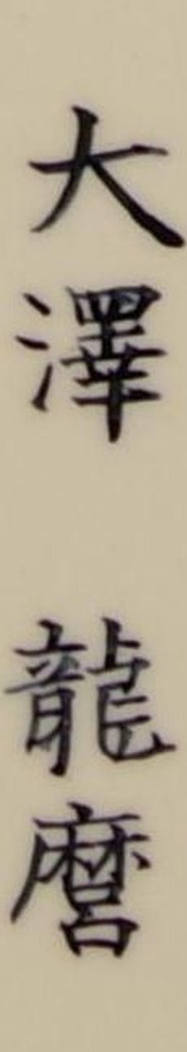大澤龍麿
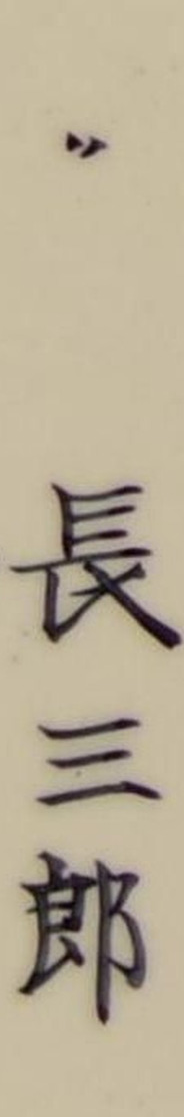長三郎
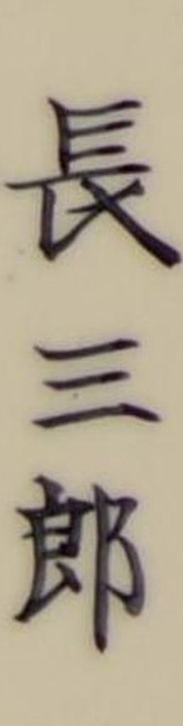長三郎
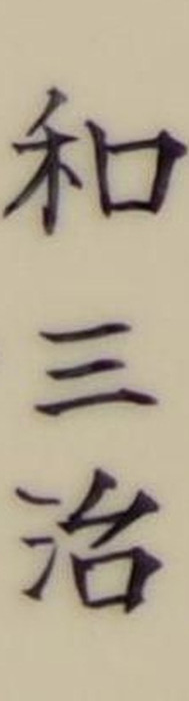和三治
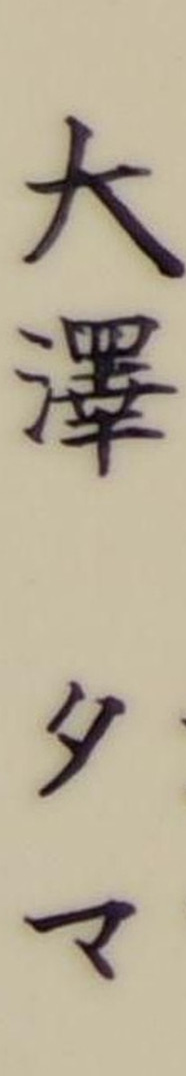大澤タマ
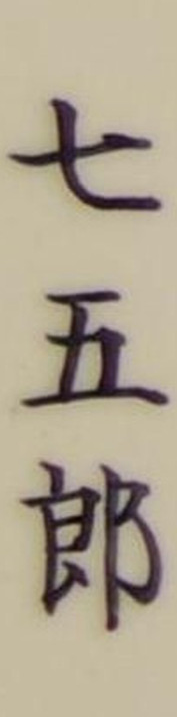七五郎

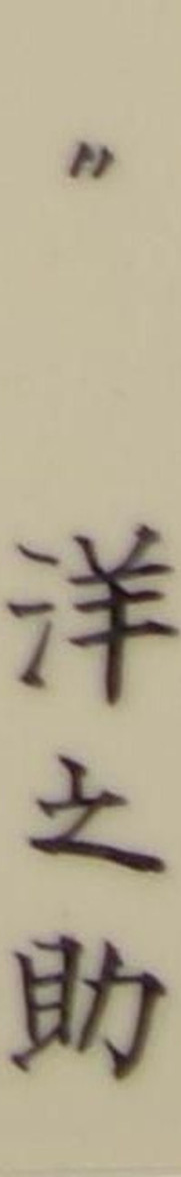洋之助
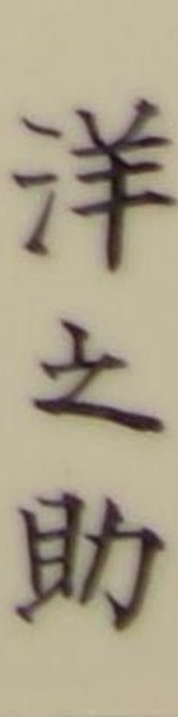洋之助
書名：E~L
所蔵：高野山金剛峯寺
